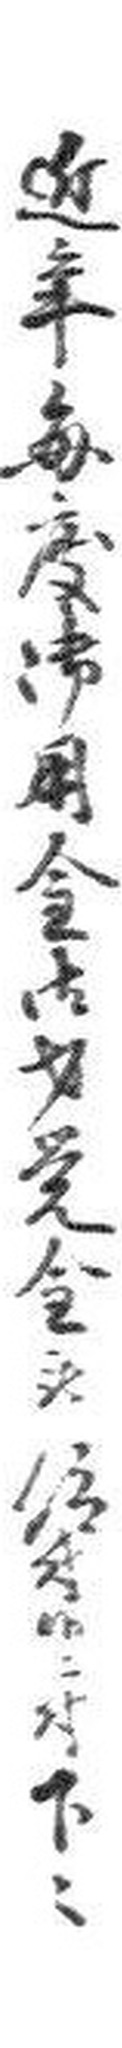近年毎度御用金御才覚金被仰付候ニ付下々
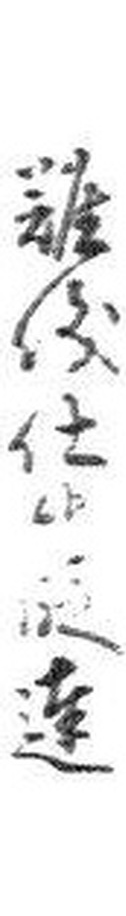難義仕候段達
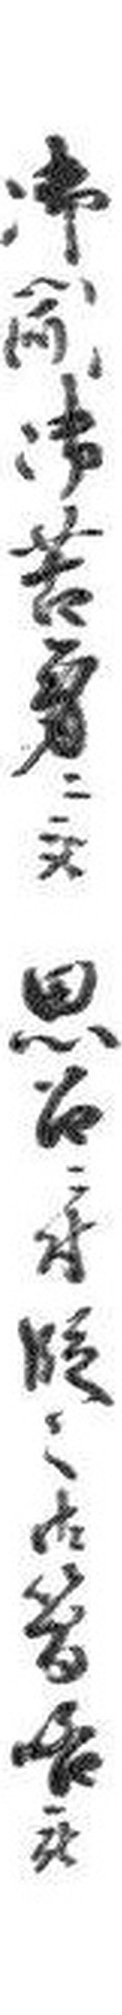御聞御苦身ニ被思召ニ付段々御簡略被
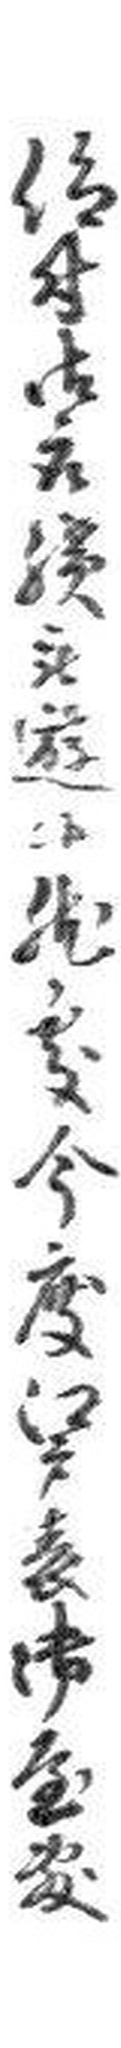仰付御取續被遊候然処今度江戸表御屋敷
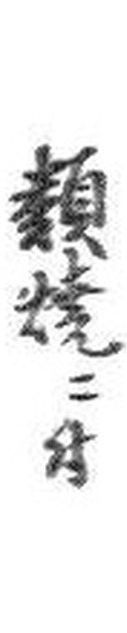類焼ニ付

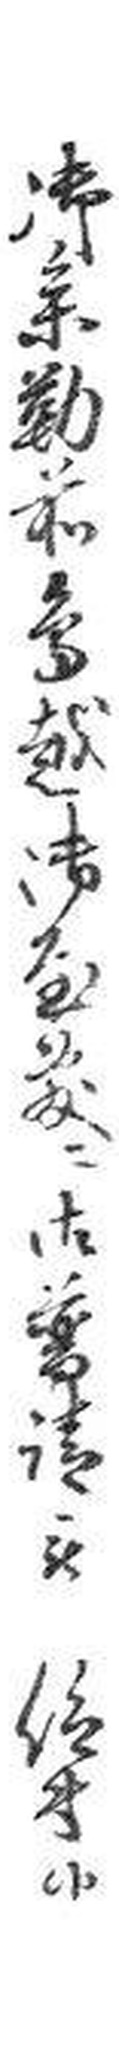御参勤前鳥越御屋敷ニ御普請被仰付候
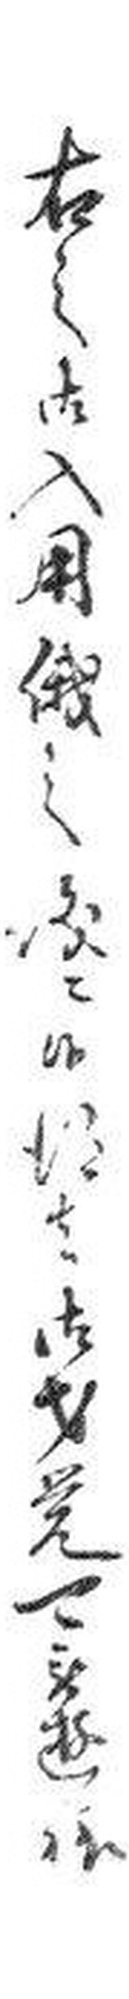右之御入用俄之儀ニ候得者御才覚可被遊趣
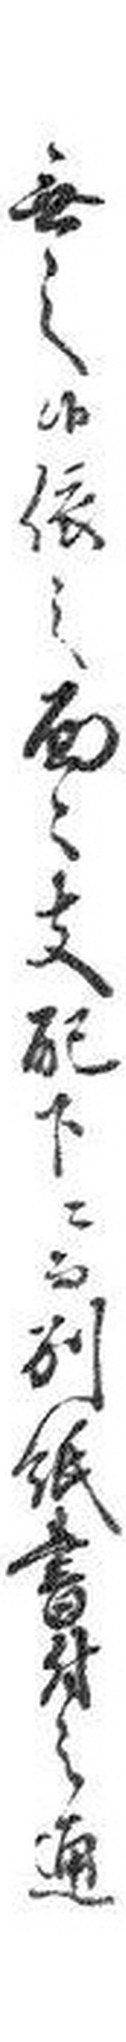無之候依之面々支配下ニ而別紙書付之通
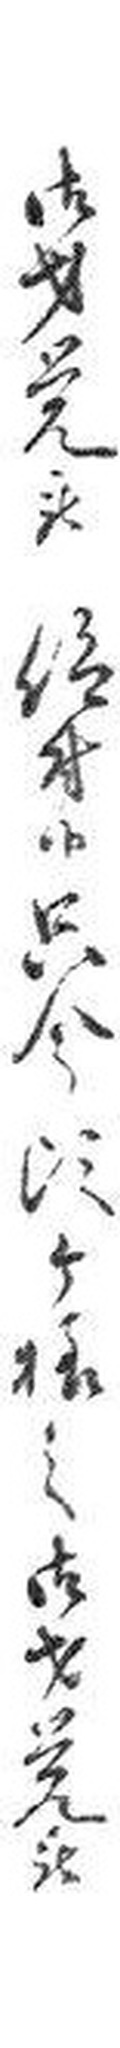御才覚被仰付候只今頃ケ様之御才覚被
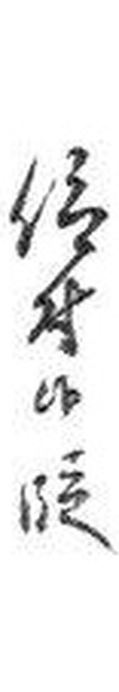仰付候段
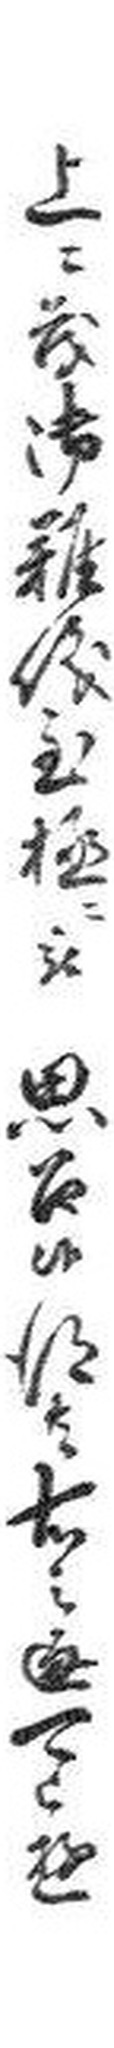上ニ茂御難儀至極ニ被思召候得共右之通可被遊
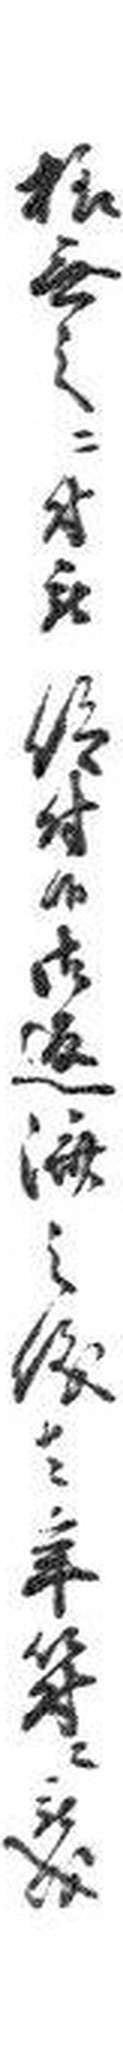様無之ニ付被仰付候御返済之儀者年符ニ被成
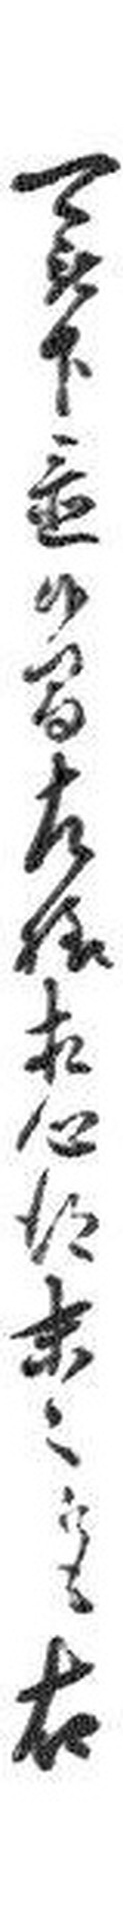可被下置候間左様相心得末々江も右
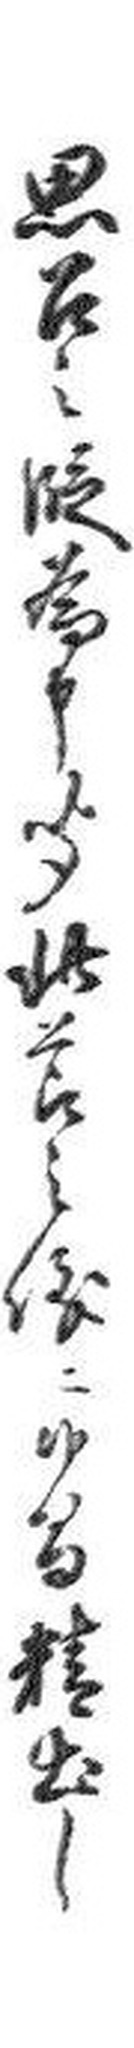思召之段為申聞此節之儀ニ候間精出し
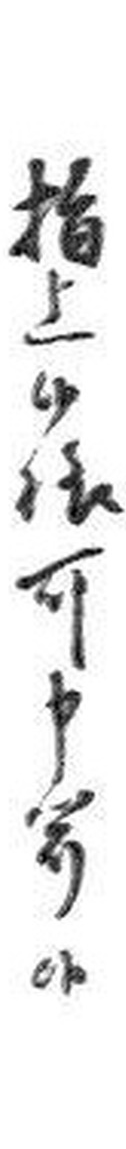指上候様可申聞候
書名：家譜 二十八 吉邦公 従宝永七年七月五日到正徳元年十二月
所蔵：福井県文書館 Fukui Prefectural Archives
